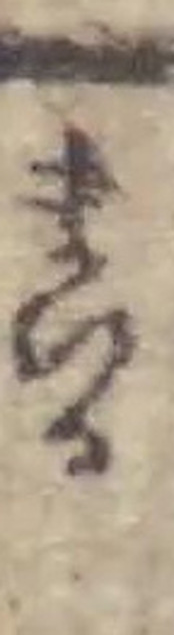まいる
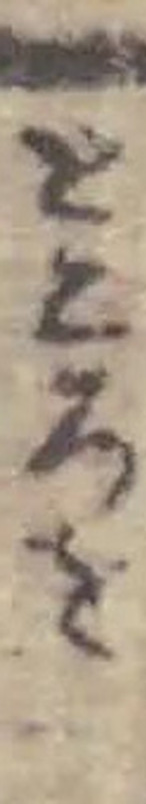ところを
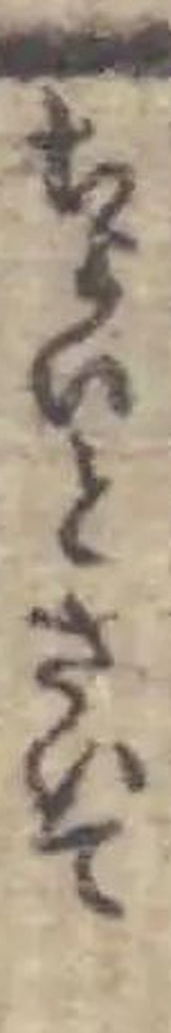ちよいとさいて
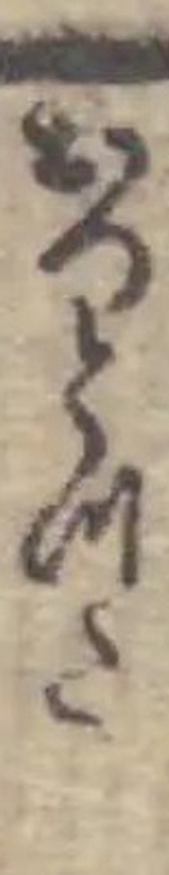おつとつた
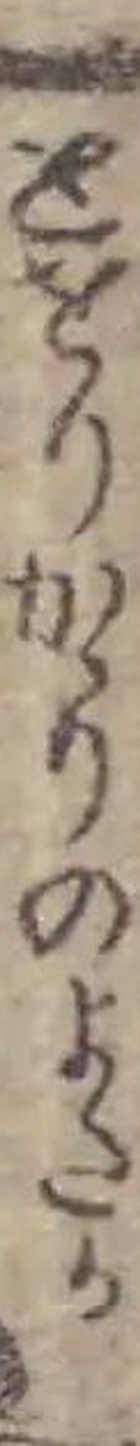とをりかゝりのよたか
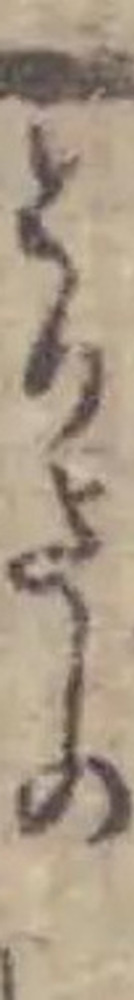とりさしの
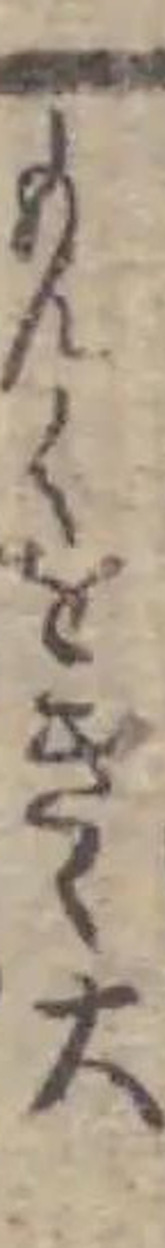もんくをきゝ大
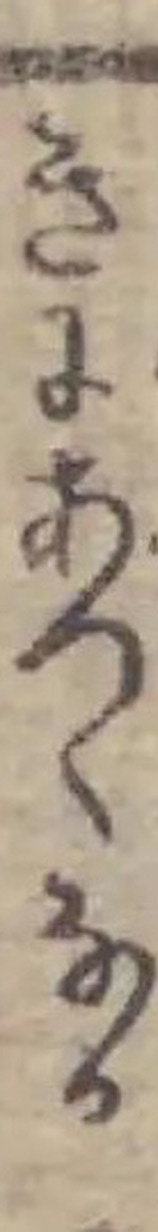きにあつくなる
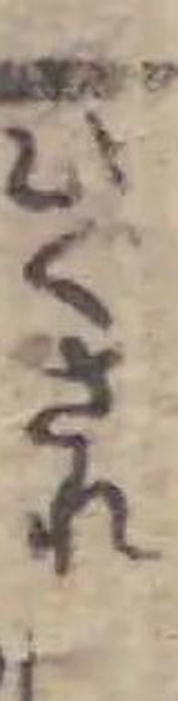此くされ
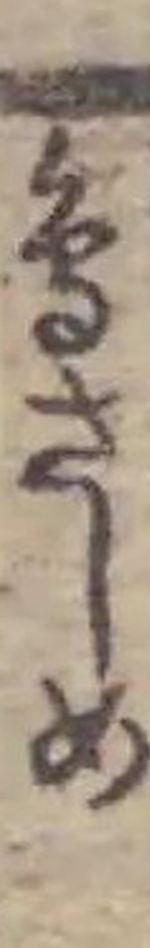鳥さしめ
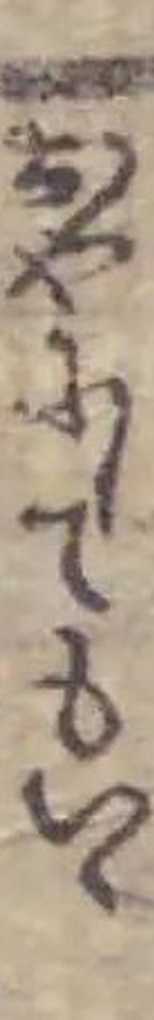おやふしてもいゝ
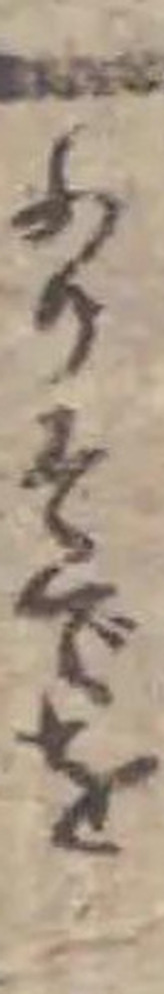ふりそでを
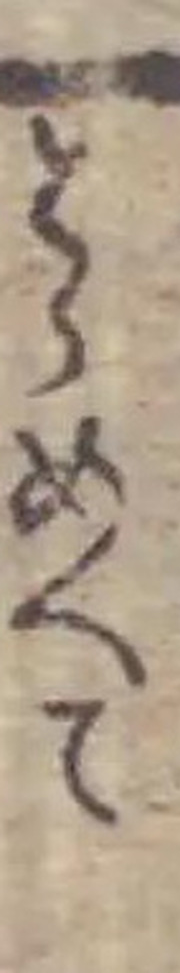とらめへて
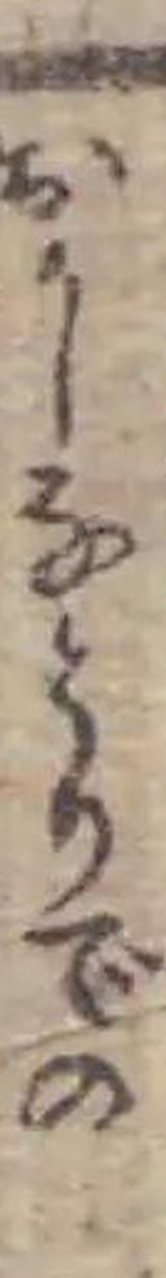おかしなとりでの
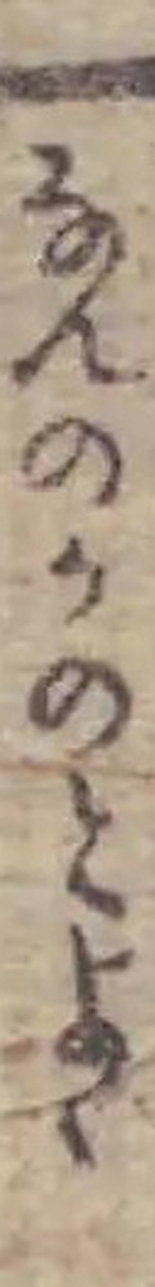なんのかのとよく
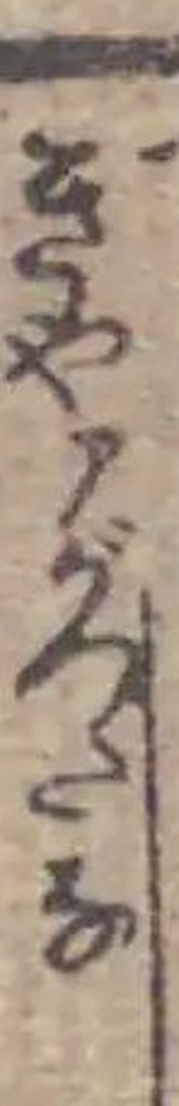きやアがつたな
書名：色男其処此処 3巻
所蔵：国立国会図書館 National Diet Library, JAPAN
